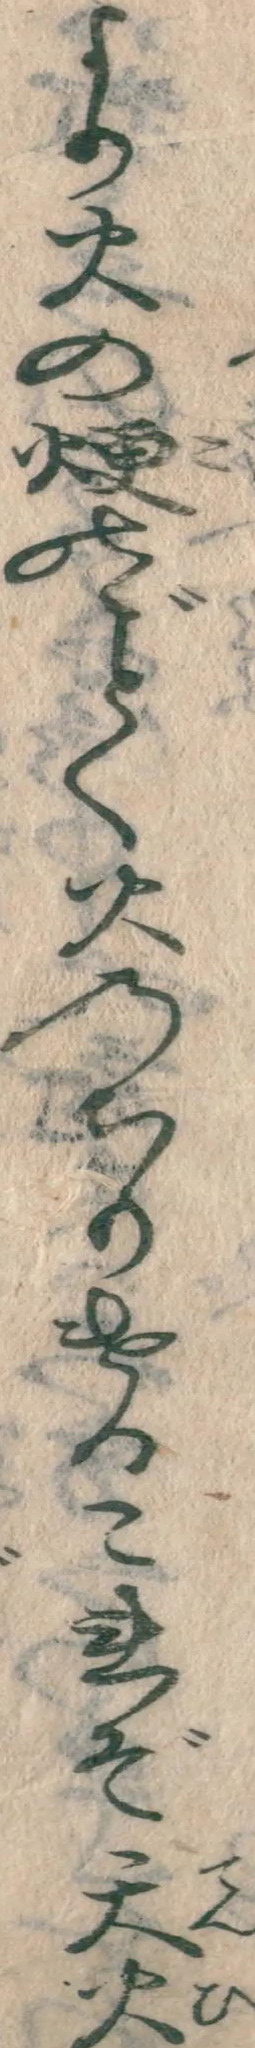より火ののごとく火のちりけるこれぞ天火
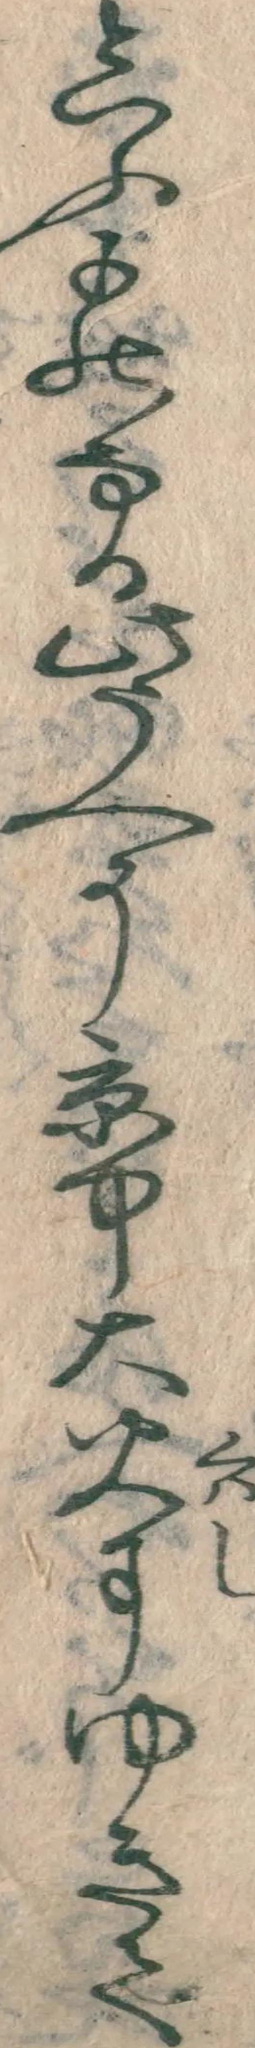といふものなる此うへに京中大火事ゆきて
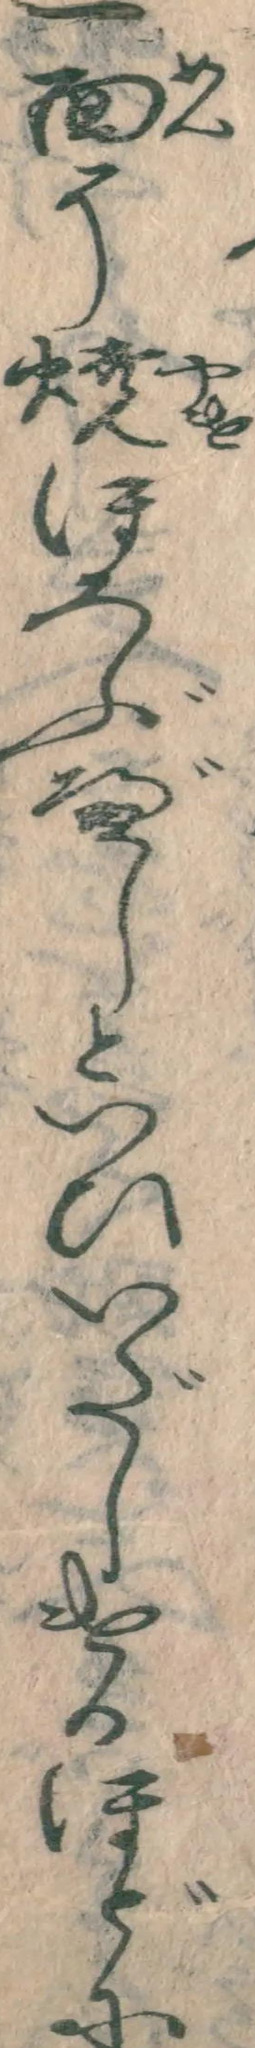一面に焼ほろぶべしといひいだしけるほどに

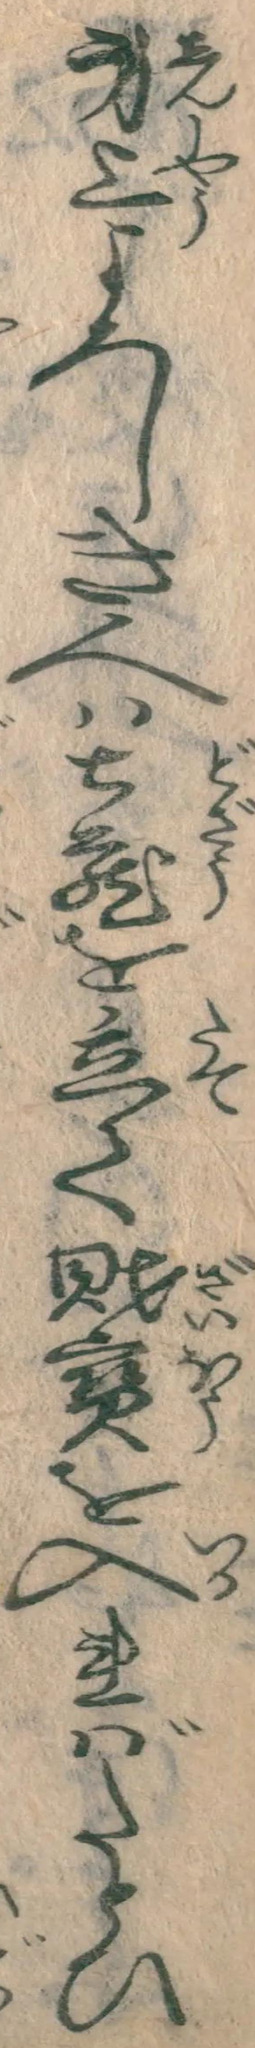身上よろしき人は土蔵を立て財寶を入ればたとひ
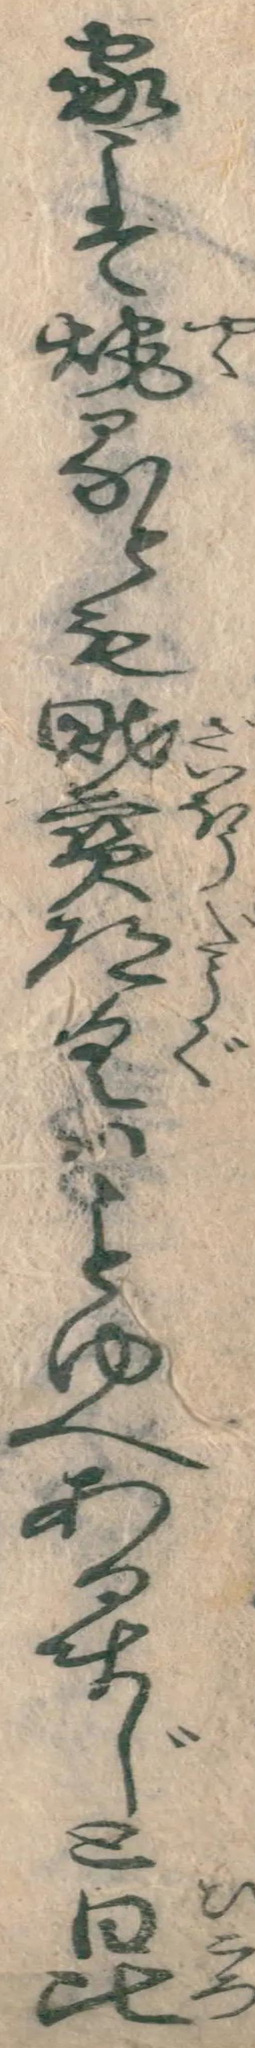家こそ焼るとも財寶道具はことゆへあるまじと日比
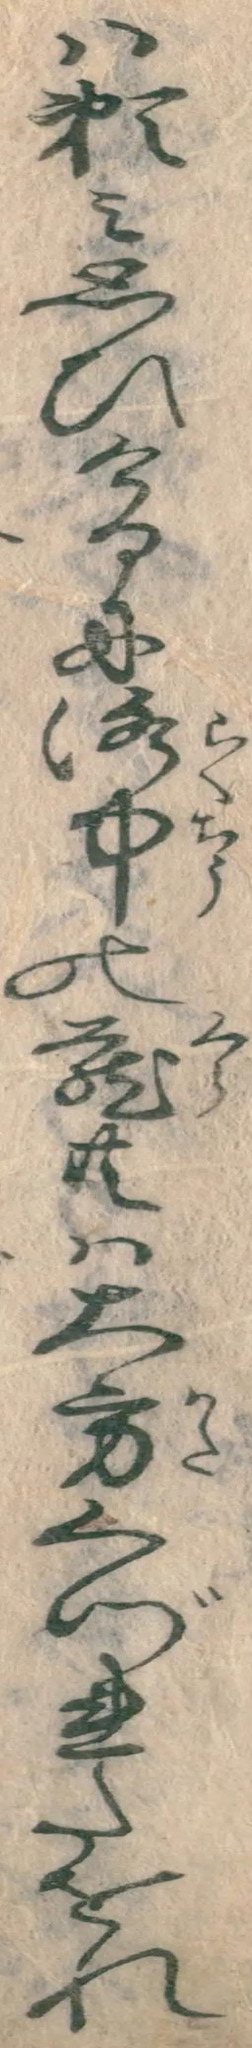は頼み思ひけるに洛中の蔵共は大方くづれたをれ
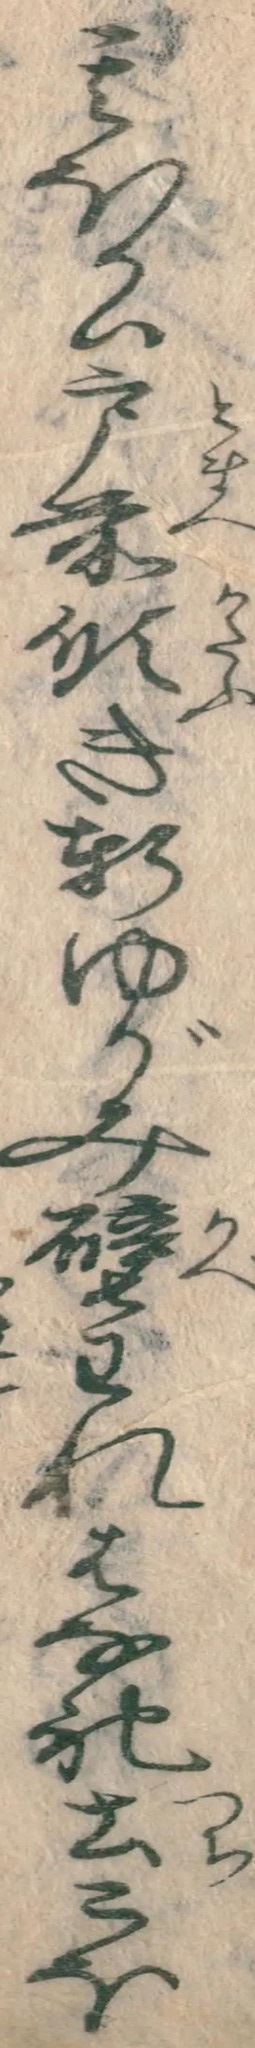其ほかは戸前傾き軒ゆがみ壁われはなれ土こほ
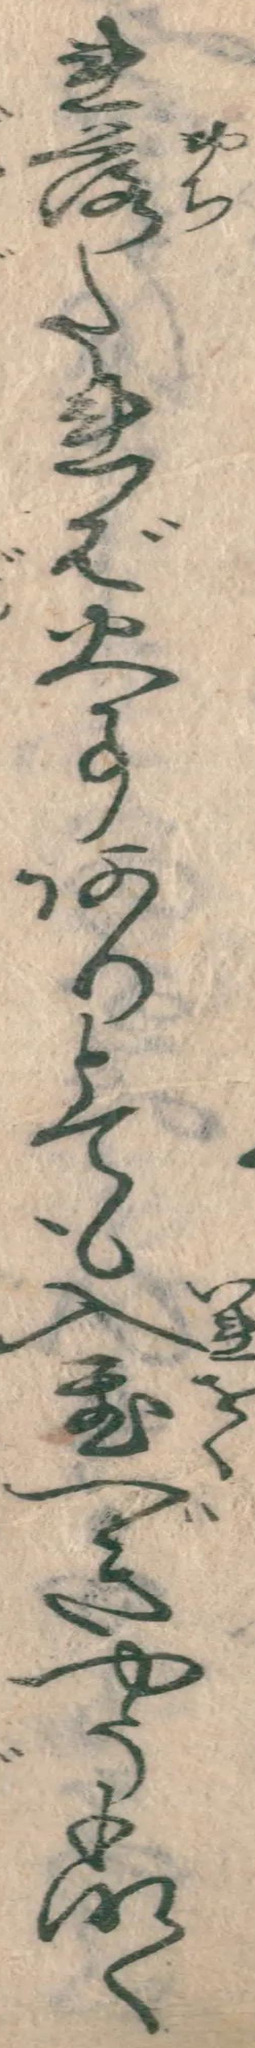れ落たれば火事ありとても入置べきやうもなく
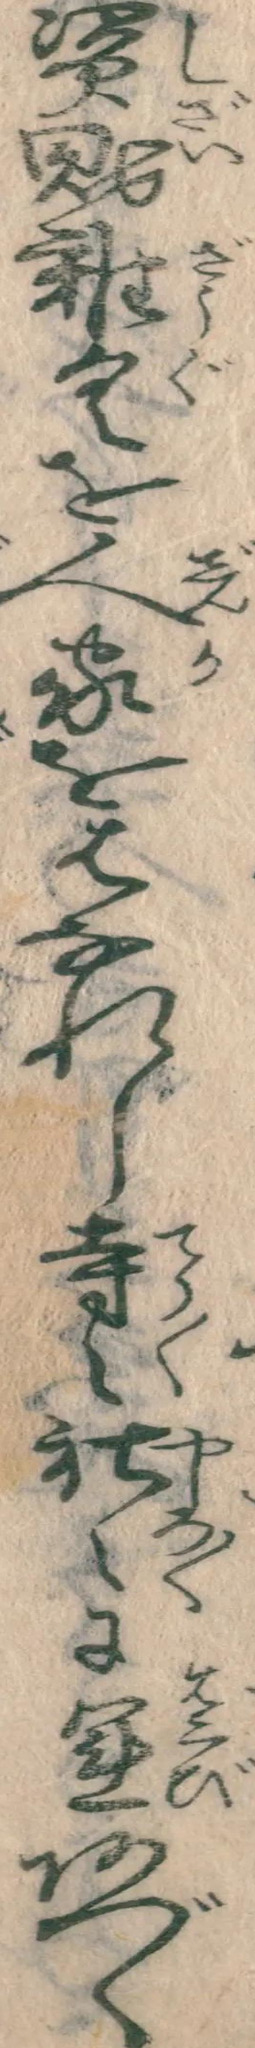資財雑具を人家をはなれし寺々社々に運あづく
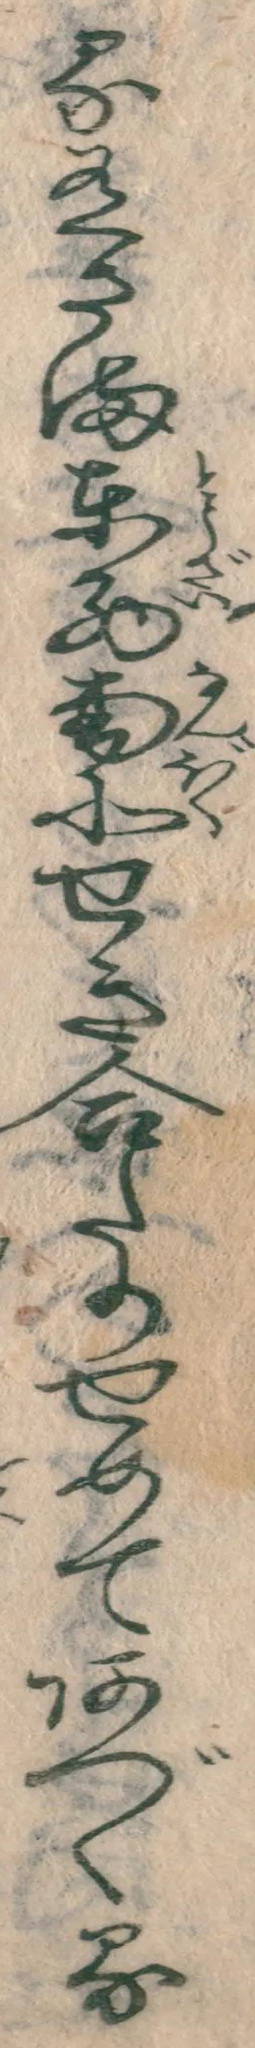る有さま東西南北せき合たかせめてあづくる
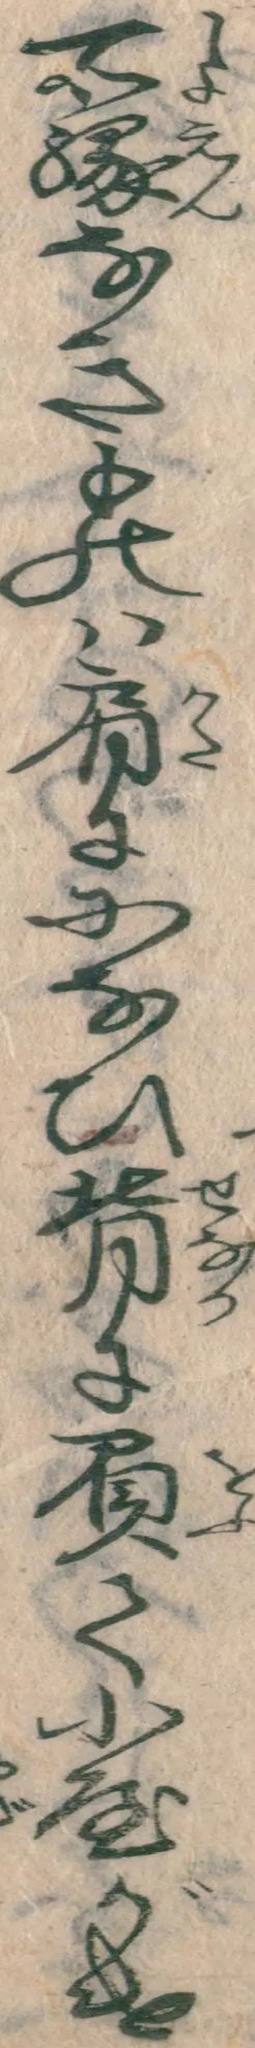所縁なきものは肩にになひ背に負て小屋がけ
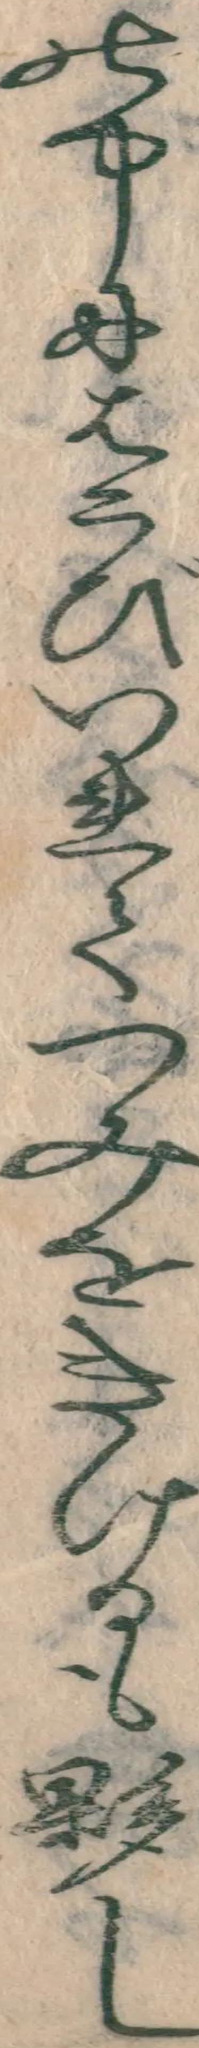の中にはこびいれてつみをきけるも夥し
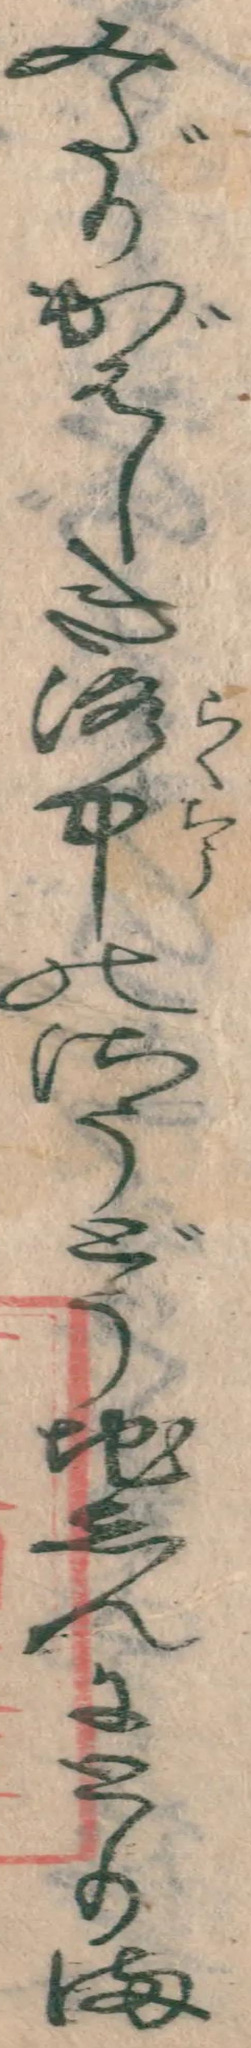みだりがはしき洛中のさうどう地しんにとりま
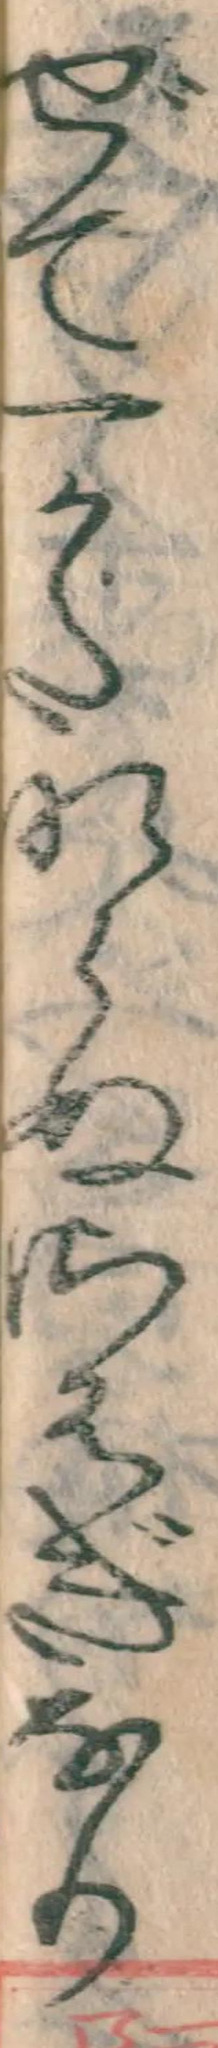ぜて一かたならぬさはさはぎなり
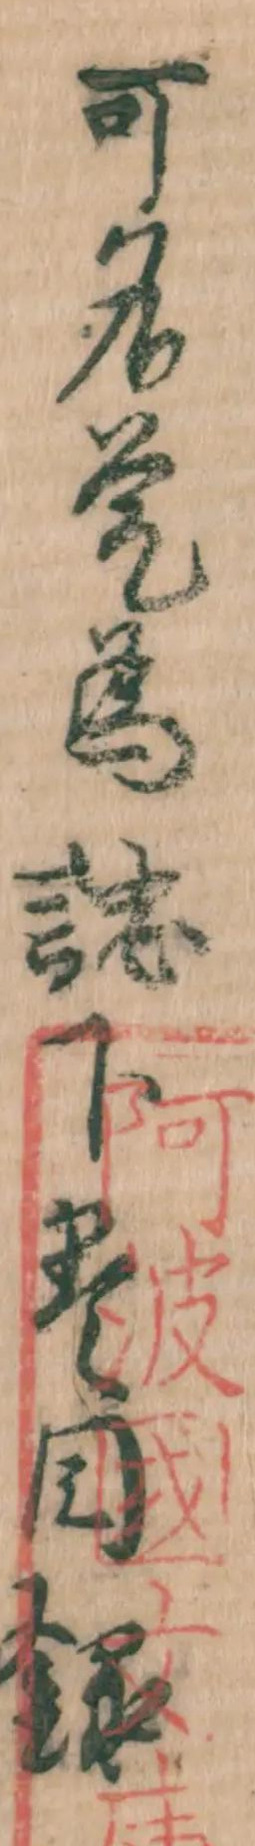可名覚為誌下書目録
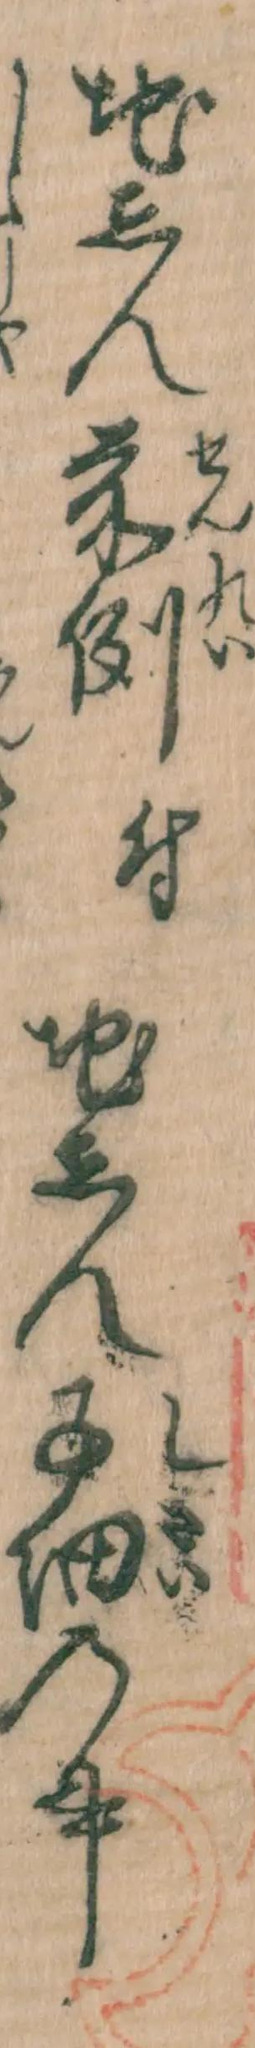一地しん前例付地しん子細の事
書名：艱難目異志. 上,下
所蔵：国立国会図書館 National Diet Library, JAPAN
